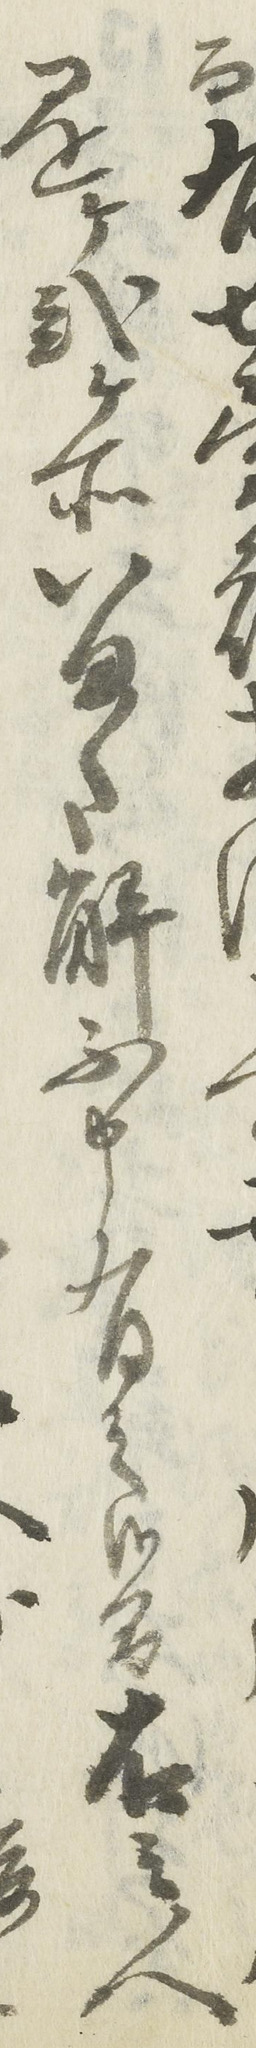懸ケ弐ケ所いまた解不申有之候間右之人
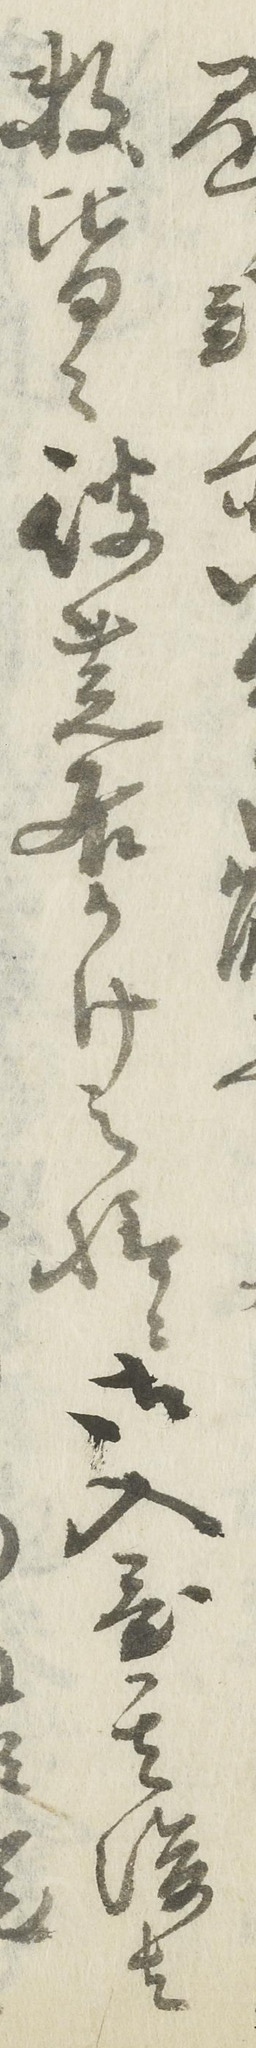数皆々彼芝居かけ之様に御入置其後は
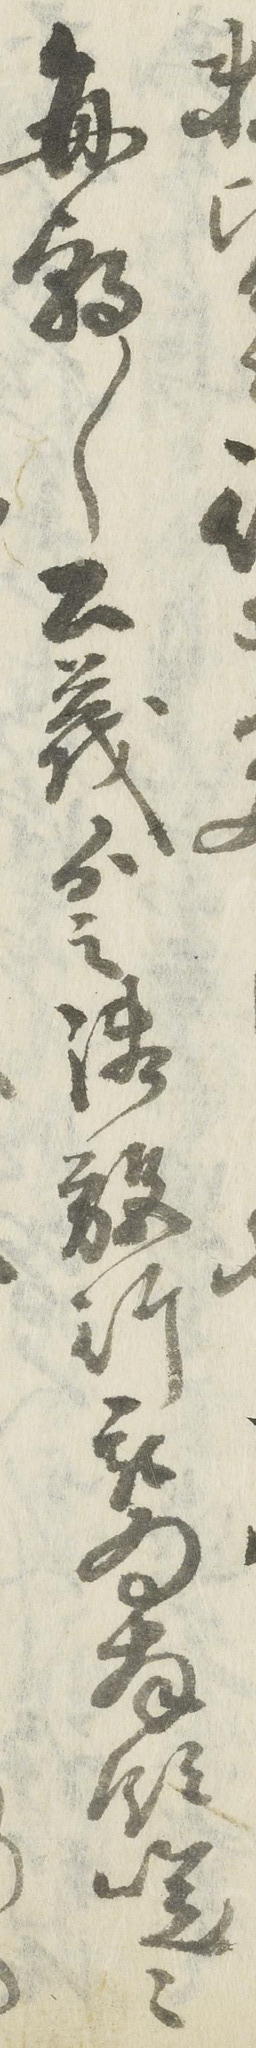毎朝〳〵公儀ゟ之御施行被為故朝晩ニ
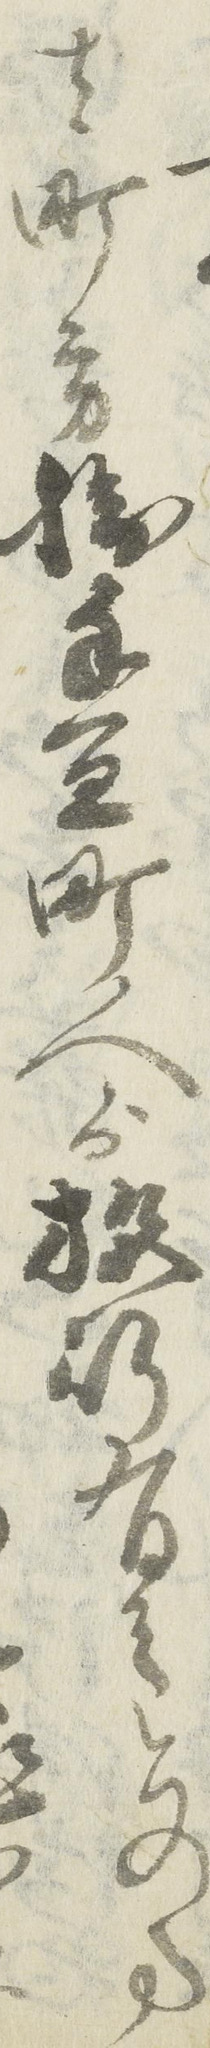は町方勝手宜町人ゟ施行有之との事
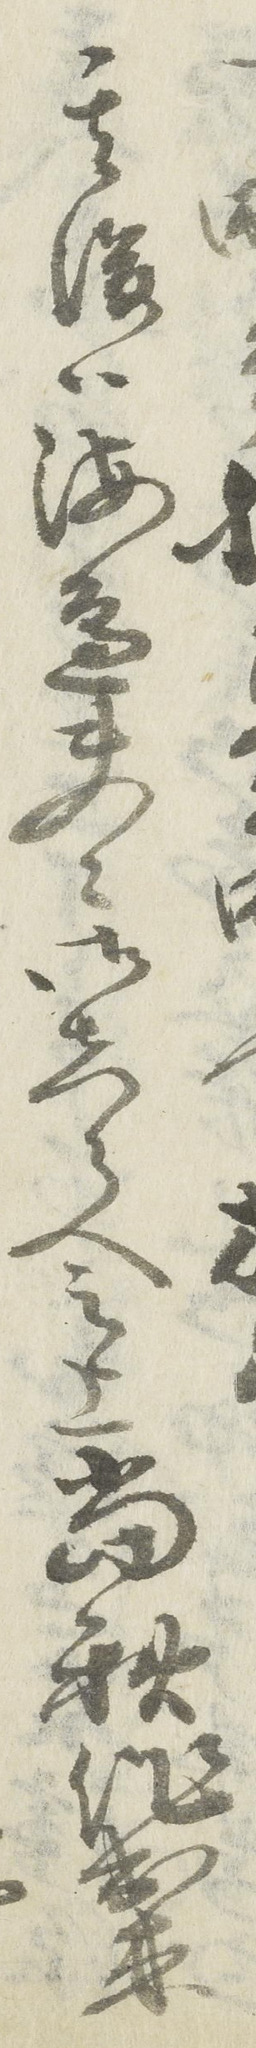其後は海辺夫々御考へ之上当秋作出来
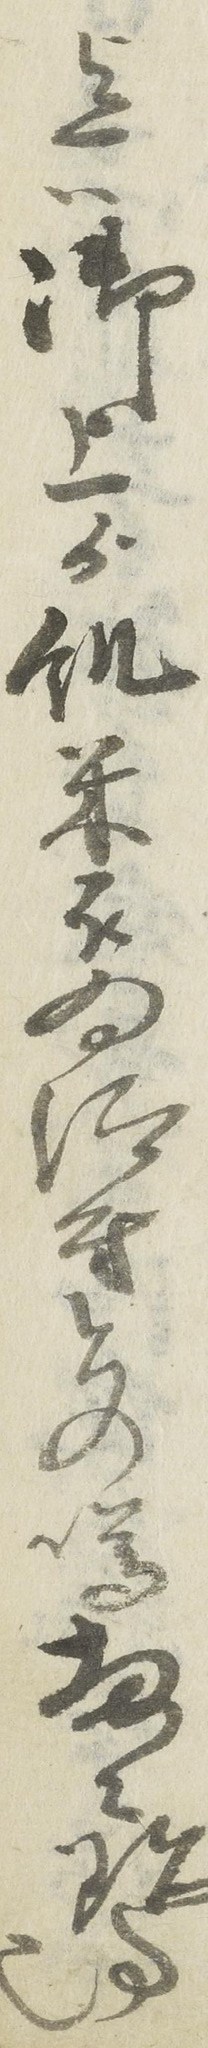迄は御上ゟ飢米被為仰付との噂扨々珍事也

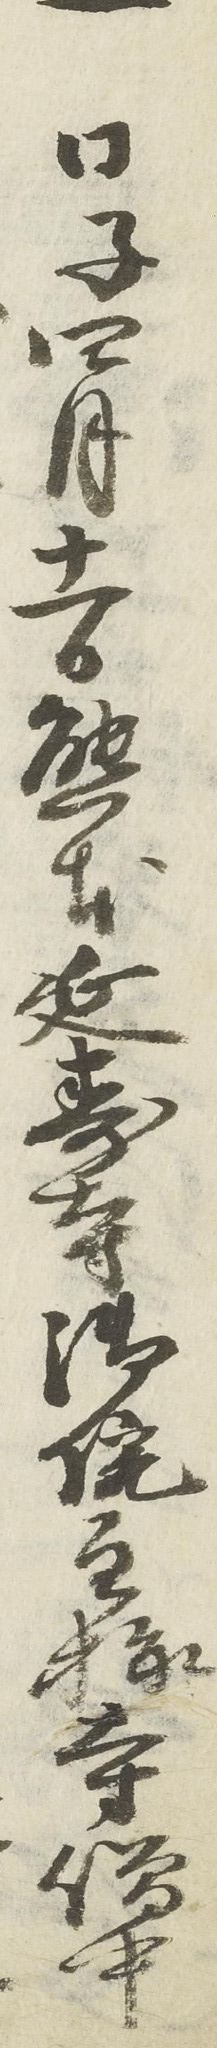一同子四月十一日熊本延壽寺御院主様寺僧中
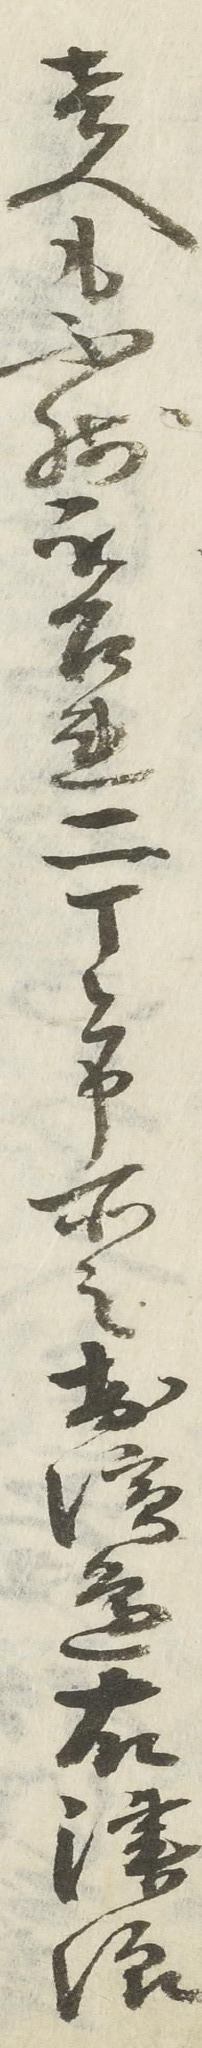壱人も不残被召連二丁と申所之於浜辺右津浪
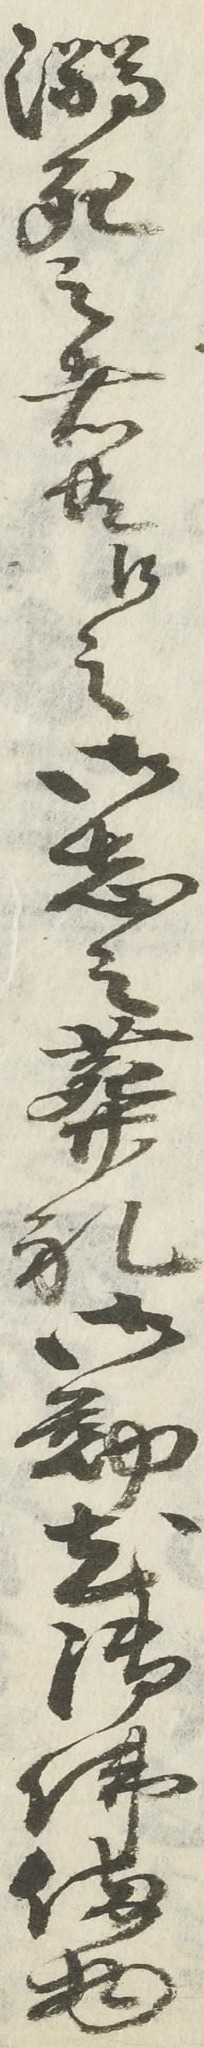溺死の者共江之御志之葬礼御勤尤御仏供物
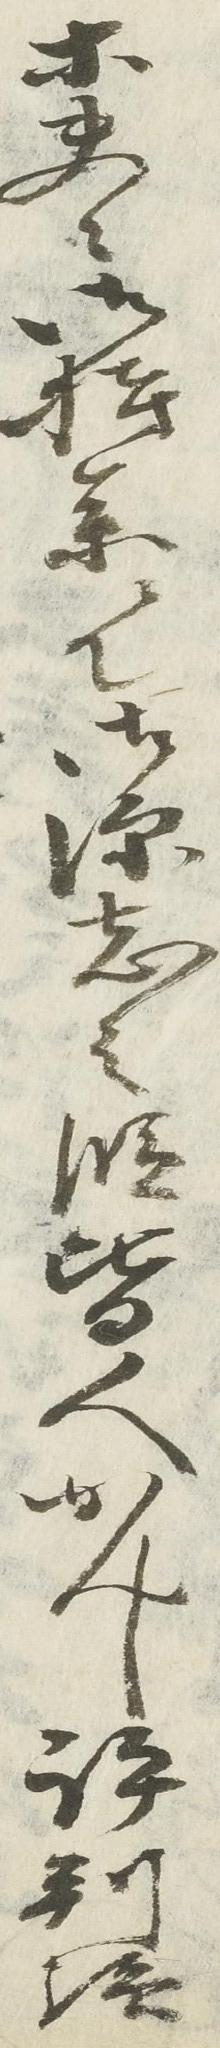等夫々御持参ニて御深志之段皆人かんし評判続
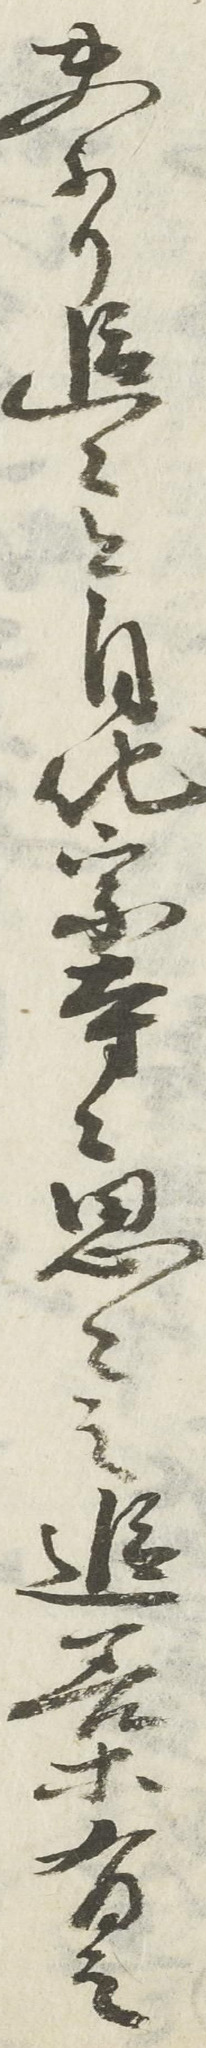夫より追々と自他宗寺二思々之追善等有之
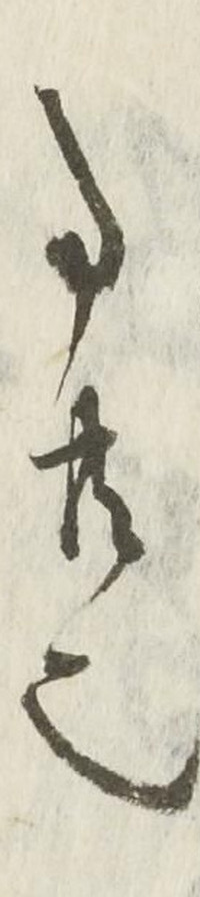事共也
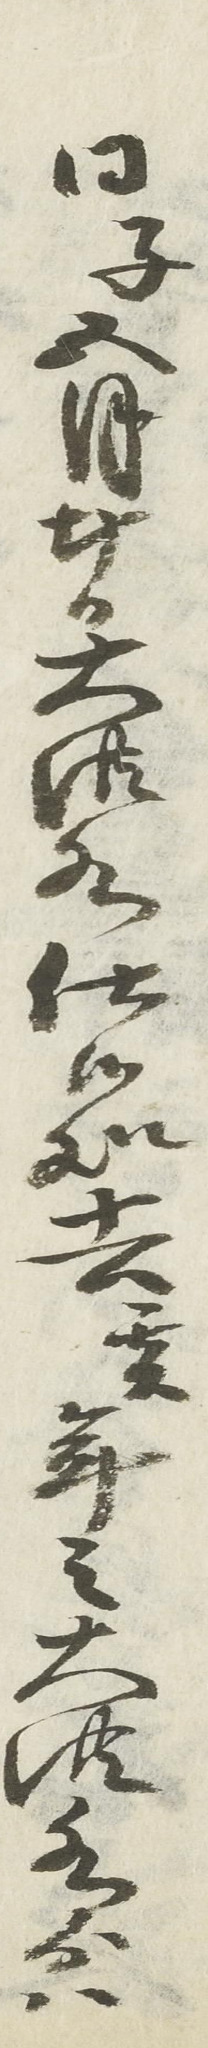一同子五月廿日大洪水仕候処去亥年之大洪水ゟは
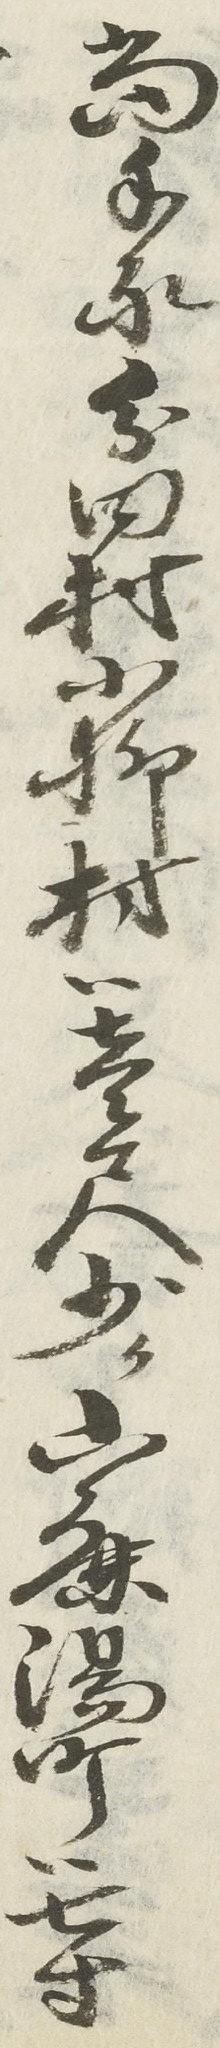当手永分田村小柳村は壱尺少ク山鹿湯町は七寸
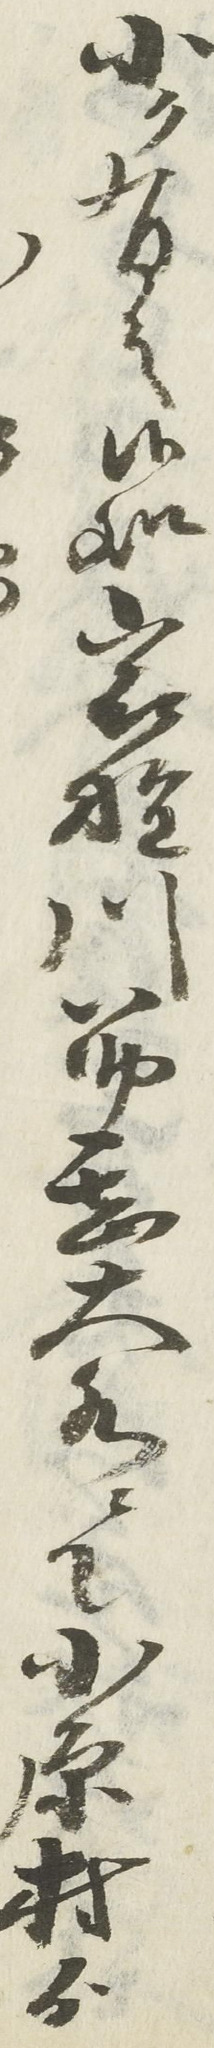少ク有之候処岩野川筋甚大水ニて小原村ゟ
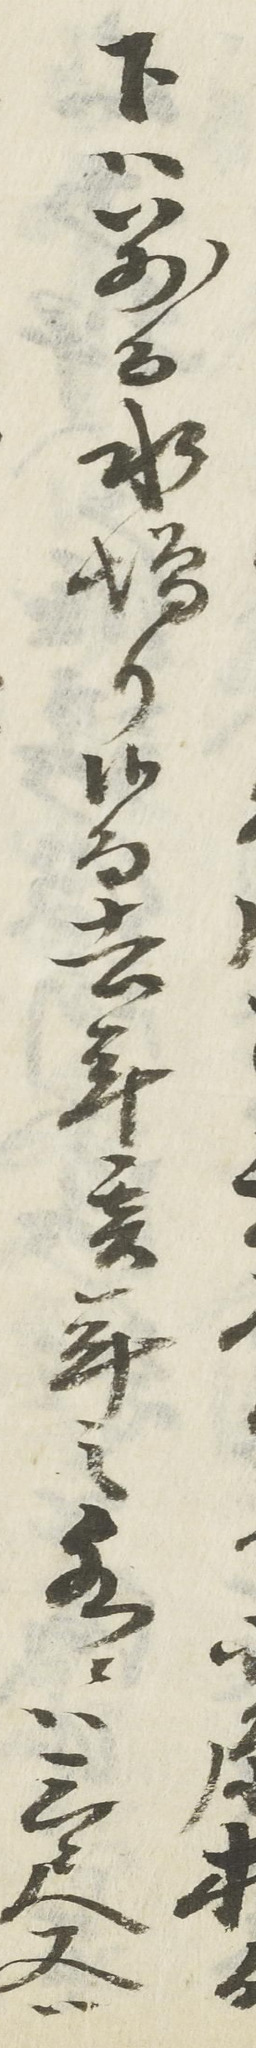下は別而水増り候而去年亥年之水ニは三尺又は
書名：後見笑
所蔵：東京大学地震研究所図書室 Earthquake Research Institute Library, The University of Tokyo, JAPAN
